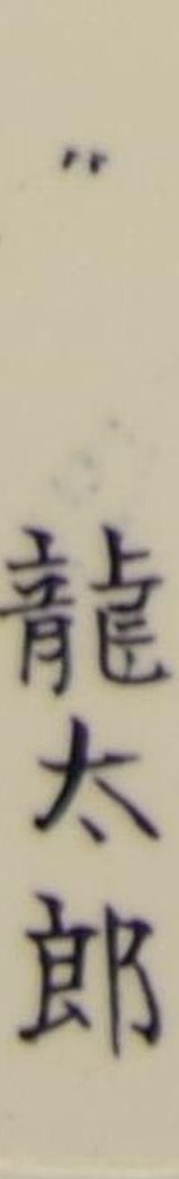龍太郎
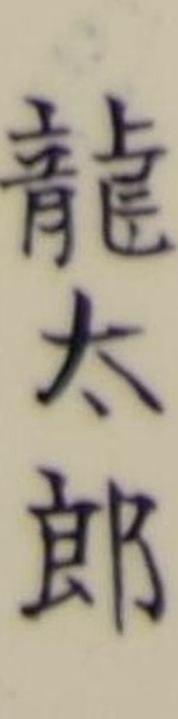龍太郎
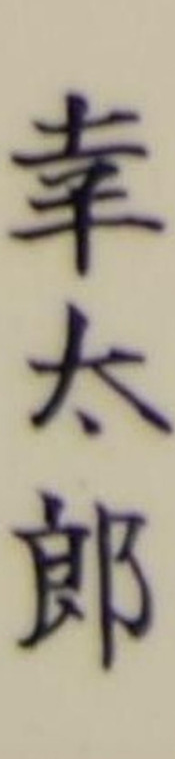幸太郎
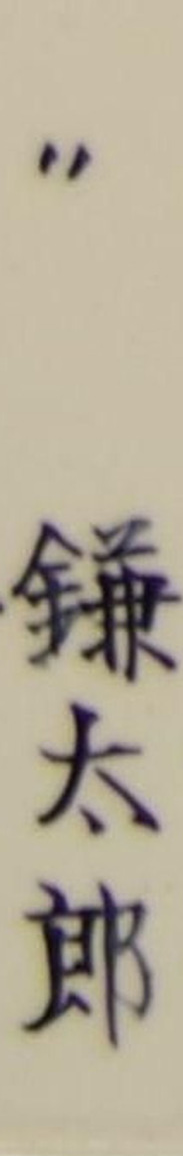鎌太郎
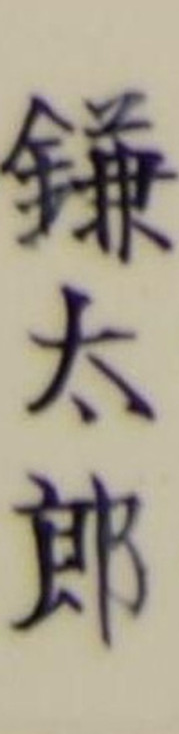鎌太郎
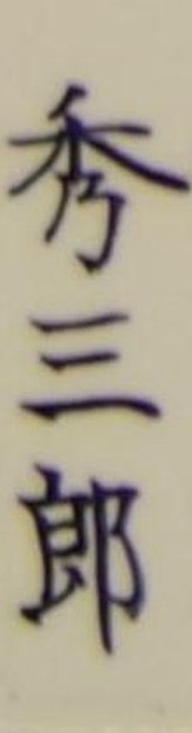秀三郎

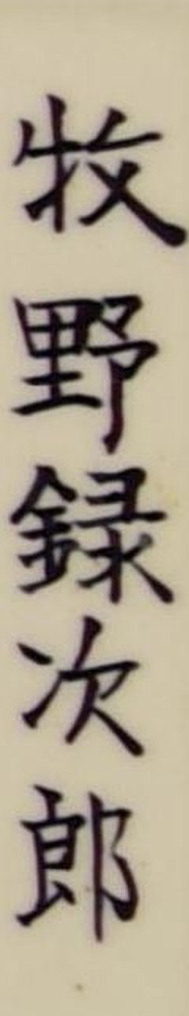牧野録次郎
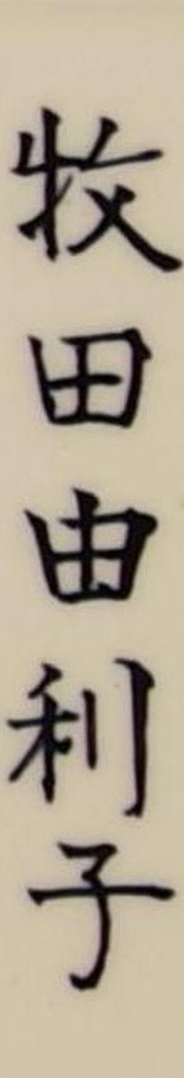牧田由利子
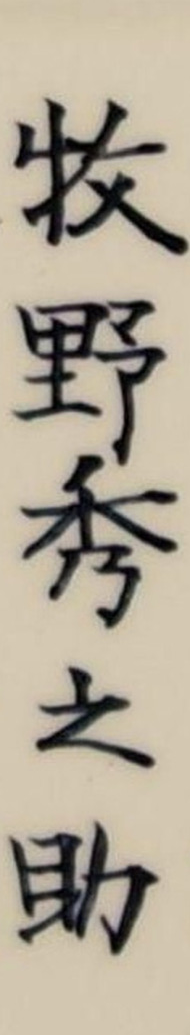牧野秀之助
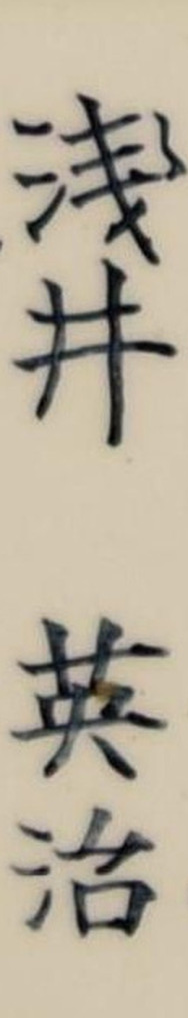浅井英治
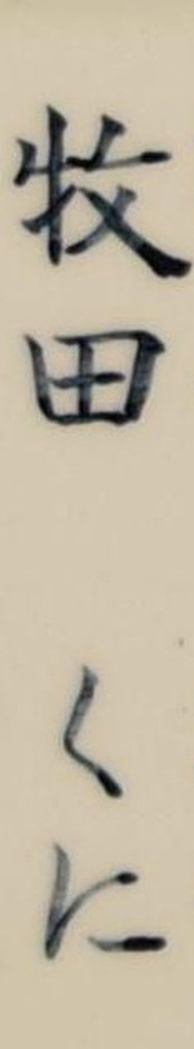牧田くに
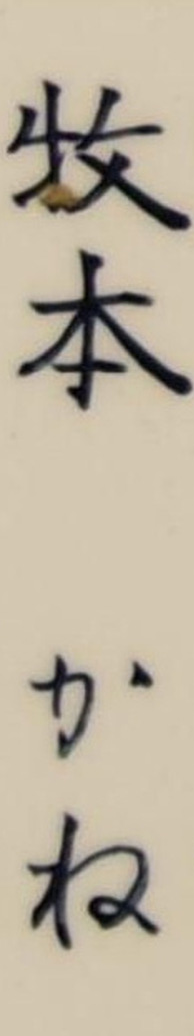牧本かね
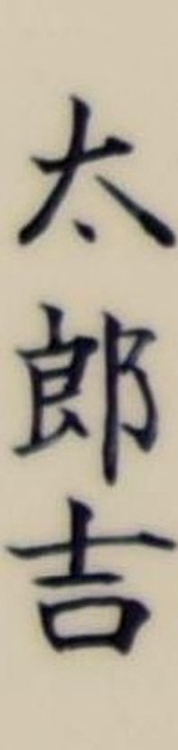太郎吉
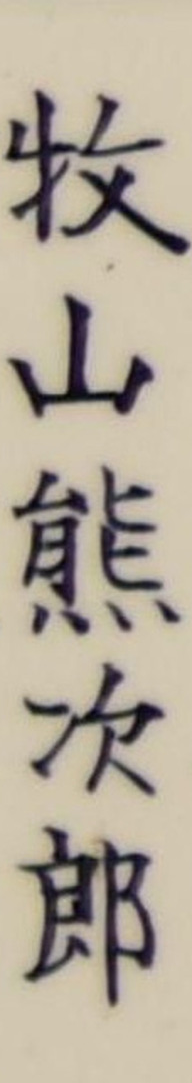牧山熊次郎
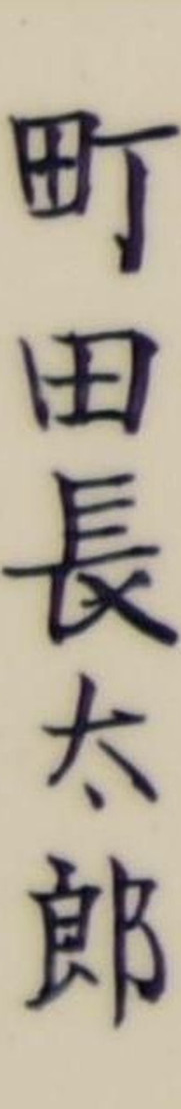町田長太郎

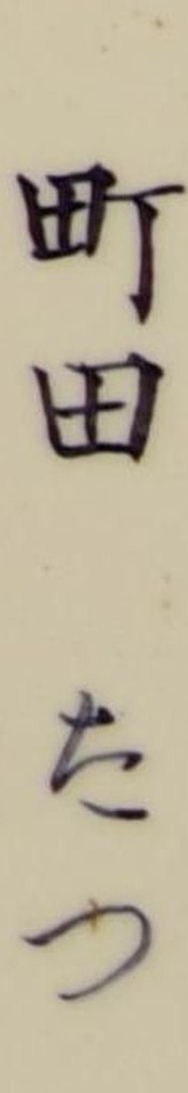町田たつ
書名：A~D
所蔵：koyasan kongobuji
